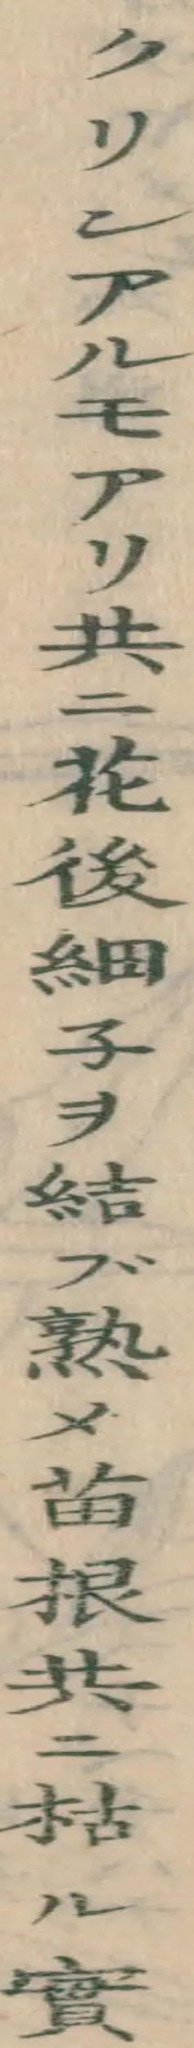クリンアルモアリ共ニ花後細子ヲ結ブ熟メ苗根共ニ枯ル実
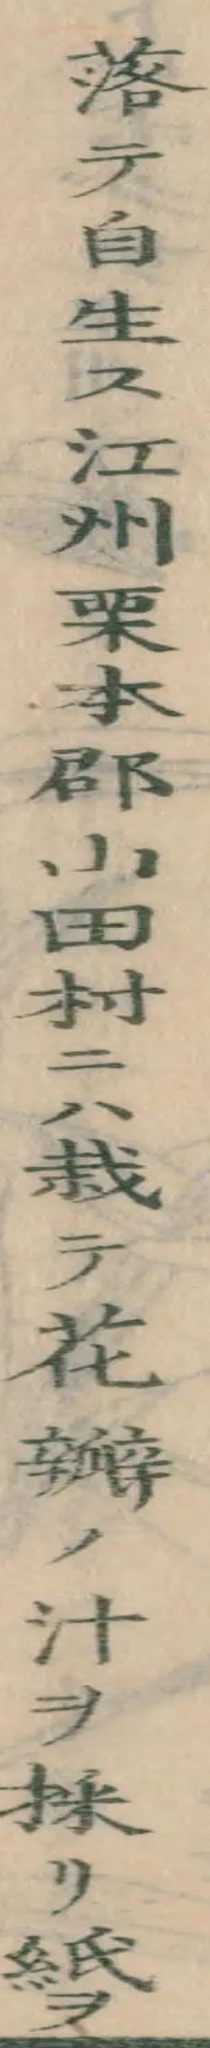落テ自生ス江州栗本郡小田村ニハ栽テ花弁ノ汁ヲ採リ紙ヲ
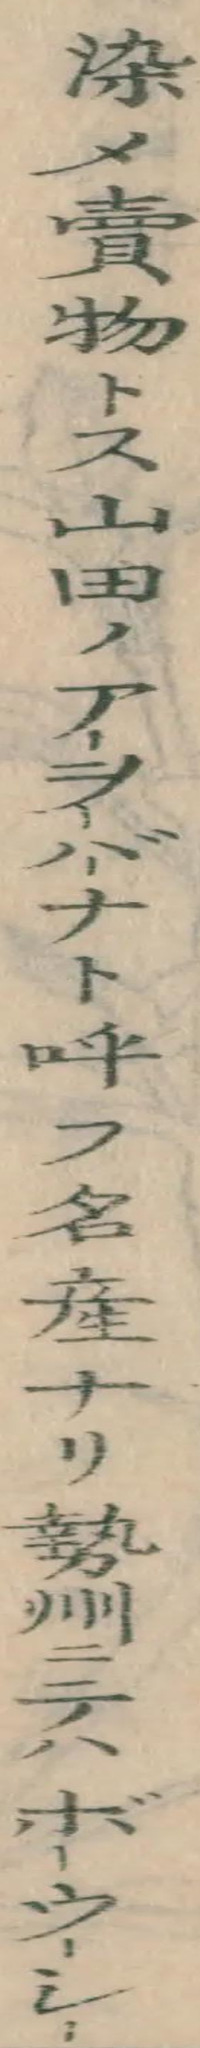染メ売物トス山田ノア-ヲ-バ-ナト呼フ名産ナリ勢州ニテハボ-ウ-シ-
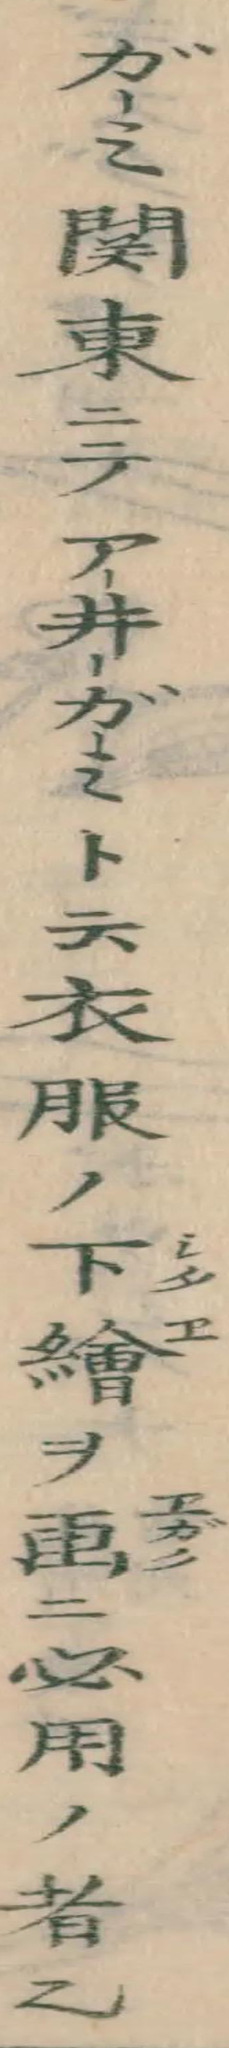ガ-ミ関東ニテア-ヰ-ガ-ミト云衣服ノ下絵ヲ画ニ必用ノ者也
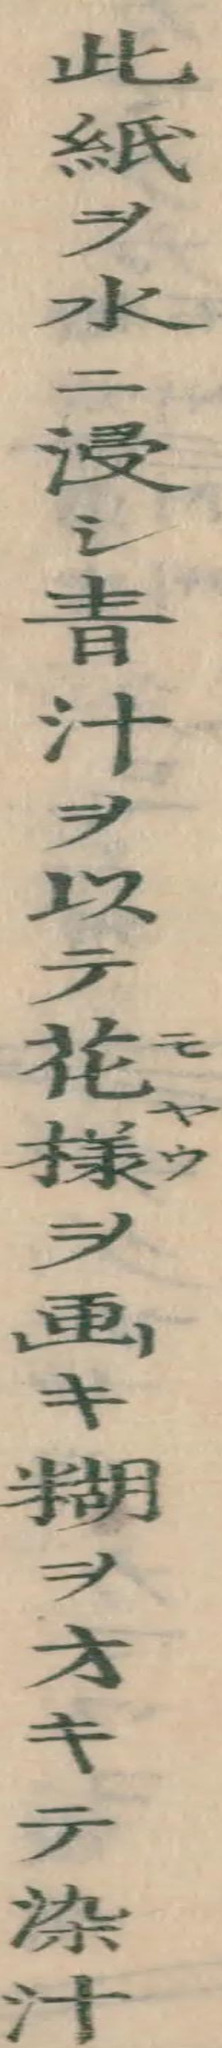此紙ヲ水ニ浸シ青汁ヲ以テ花様ヲ画キ糊ヲオキテ染汁
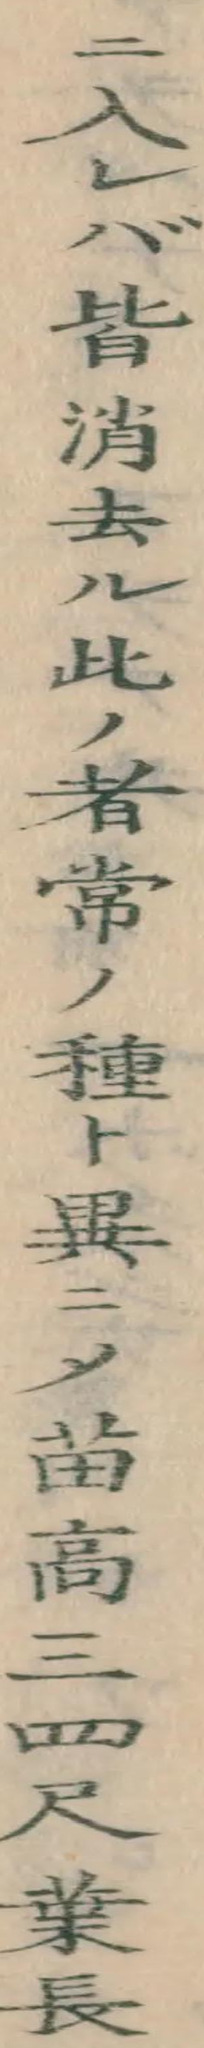ニ入レバ皆消去ル此ノ者常ノ種ト異ニシテ苗高三四尺葉長
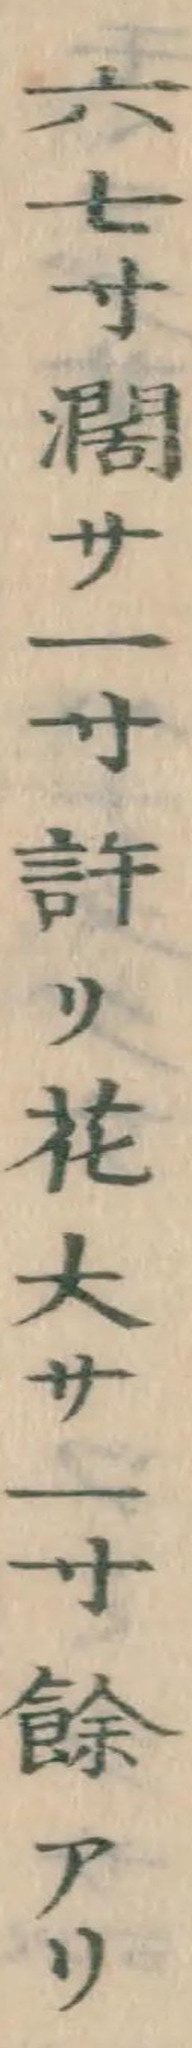六七寸闊サ一寸許リ花大サ一寸余アリ
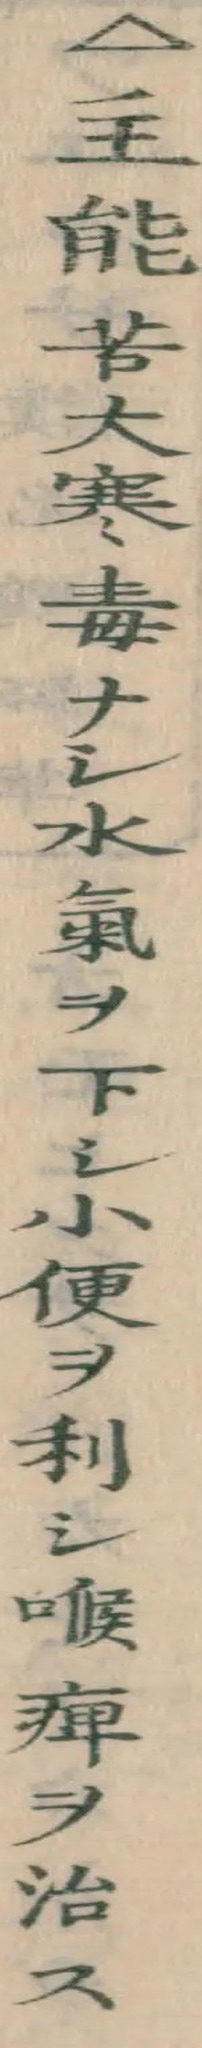△主能苦大寒毒ナシ水気ヲ下シ小便ヲ利シ喉痺ヲ治ス

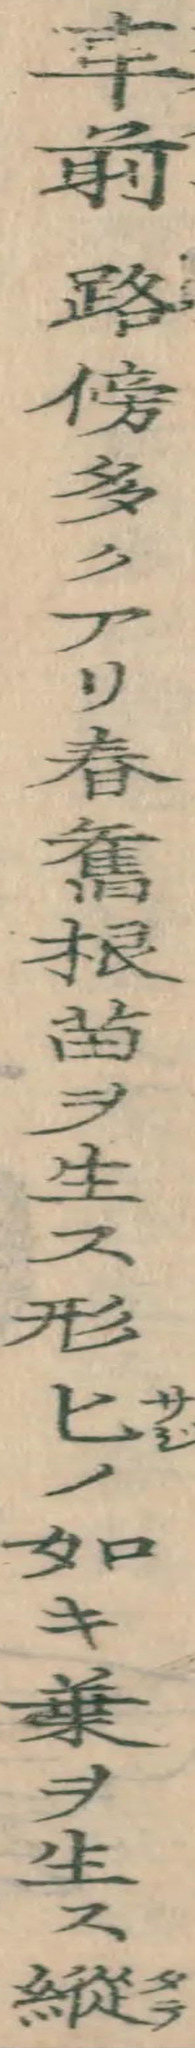車前路傍多クアリ春旧根苗ヲ生ス形匕ノ如キ葉ヲ生ス縦
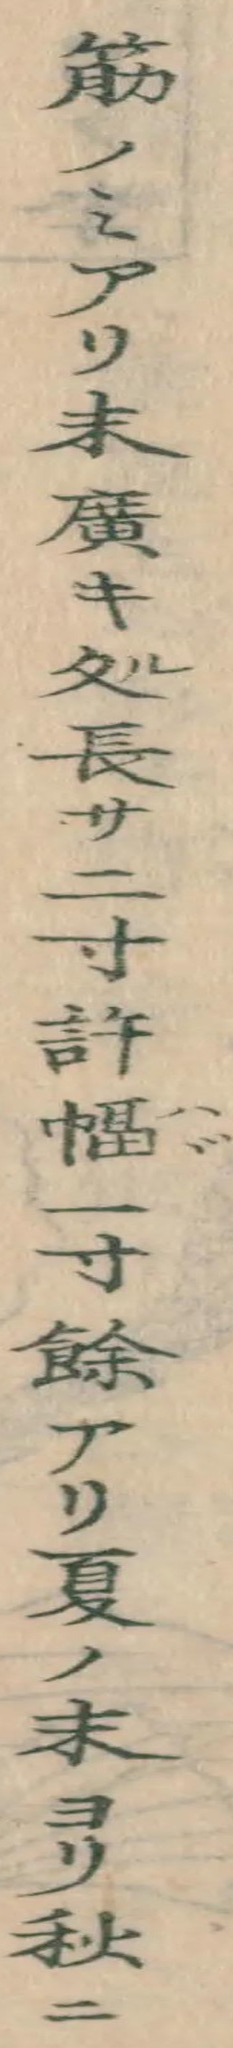筋ノミアリ末広キ処長サ二寸許幅一寸余アリ夏ノ末ヨリ秋ニ
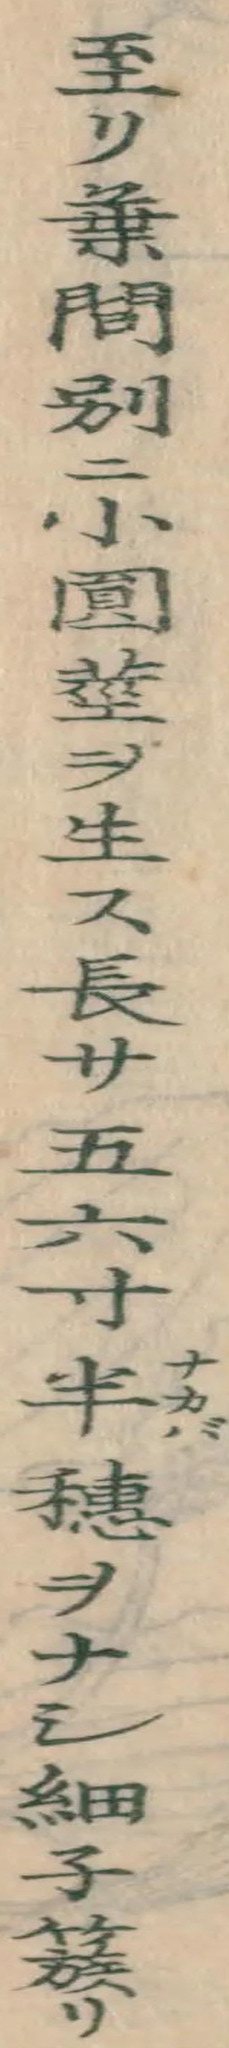至リ葉間別ニ小円茎ヲ生ス長サ五六寸半穂ヲナシ細子簇リ
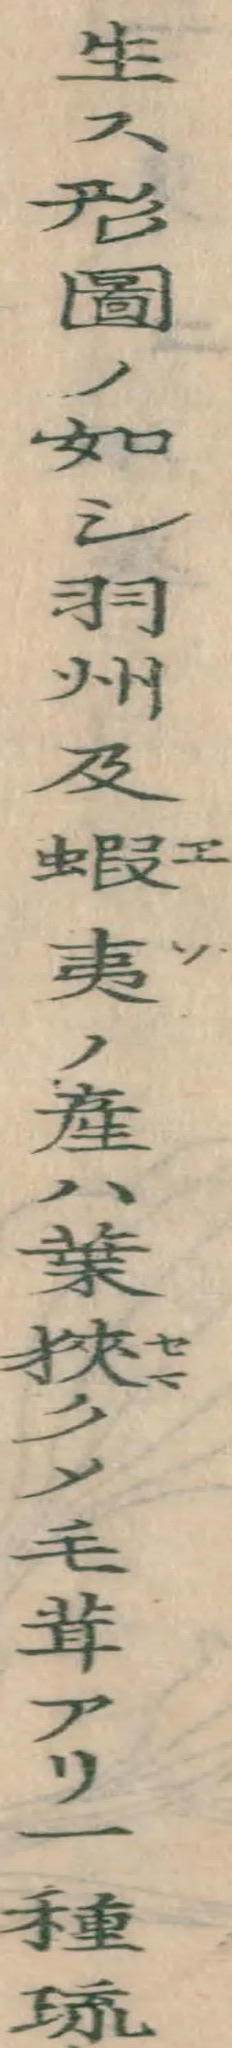生ス形図ノ如シ羽州及蝦夷ノ産ハ葉狭クシテ毛茸アリ一種琉-
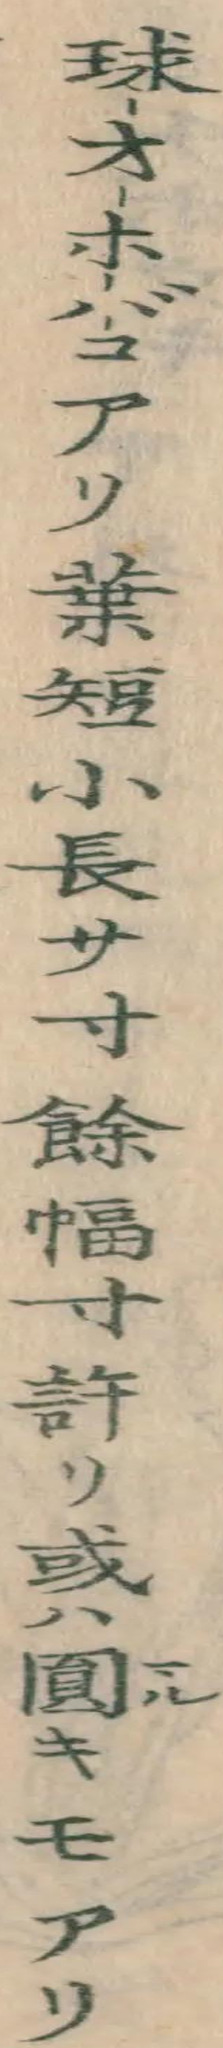球-オ-ホ-バ-コアリ葉短小長サ寸余幅寸許リ或ハ円キモアリ
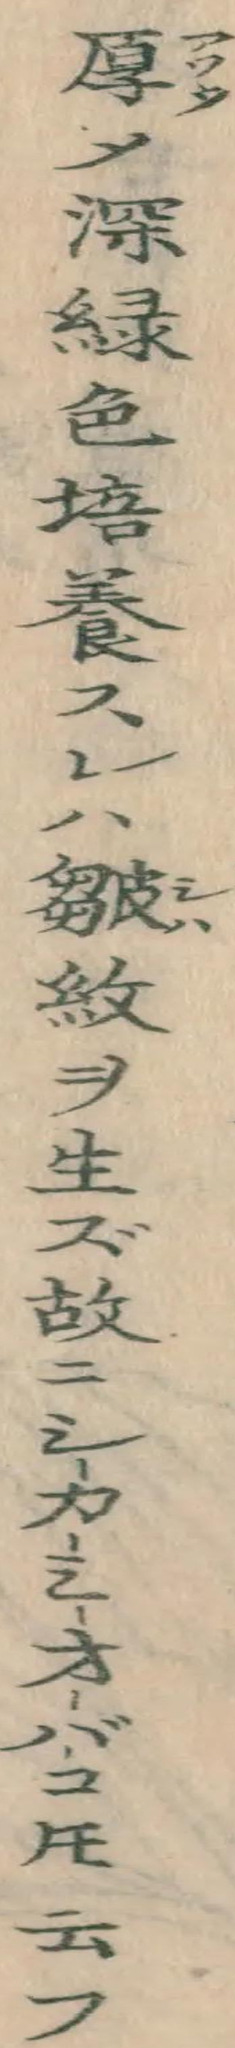厚シテ深緑色培養スレハ皺紋ヲ生ズ故ニシ-カ-ミ-オ-バ-コトモ云フ
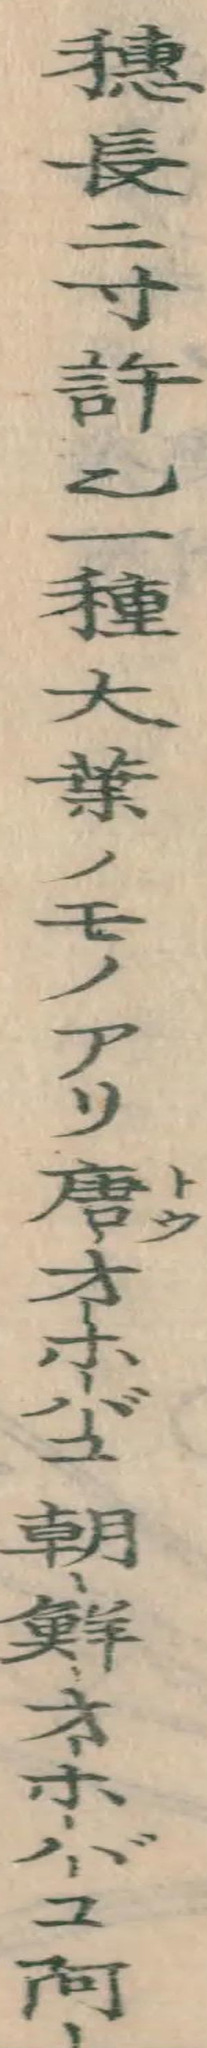穂長二寸許也一種大葉ノモノアリ唐-オ-ホ-バ-コ朝-鮮-オ-ホ-バ-コ阿-
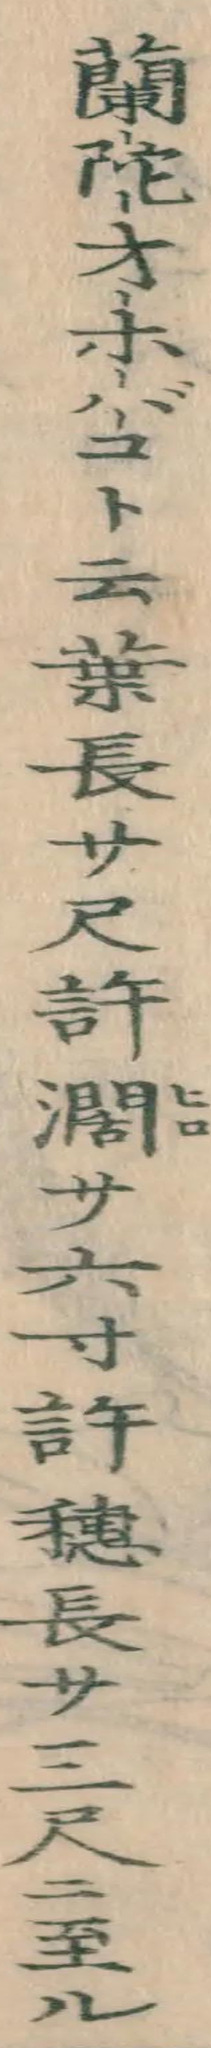蘭-陀-オ-ホ-バ-コト云葉長サ尺許闊サ六寸許穂長サ三尺ニ至ル
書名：これこれ草 2巻. [2]
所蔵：国立国会図書館 National Diet Library, JAPAN
